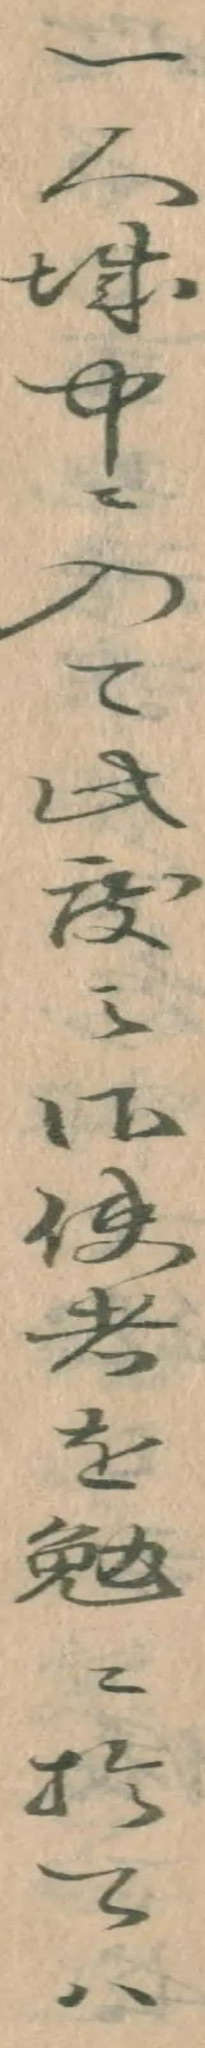一人城中に入て此度之御使者を勉に於ては
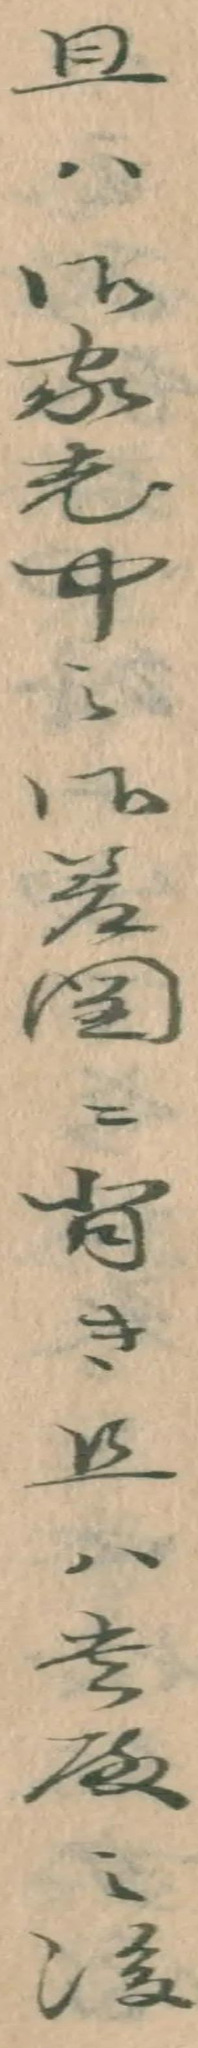且は御家老中之御差図に背き且は貴殿之後
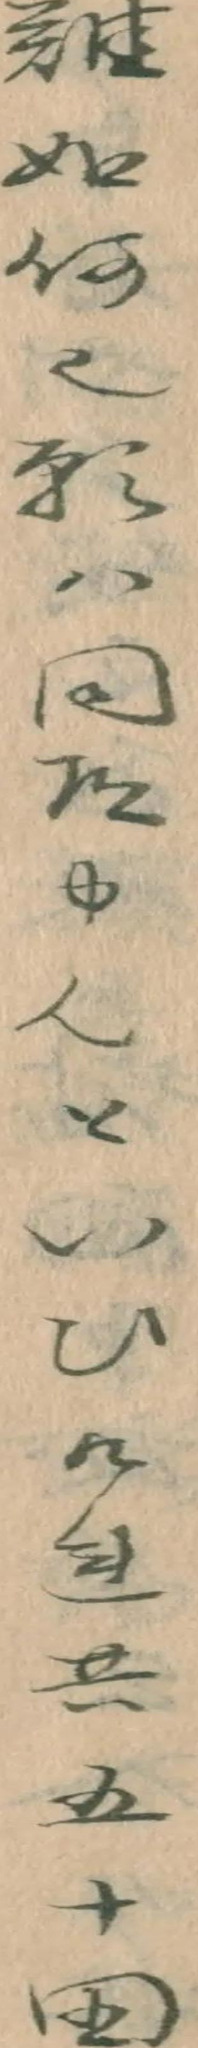難如何也頼は同道申んといひけ連共五十田
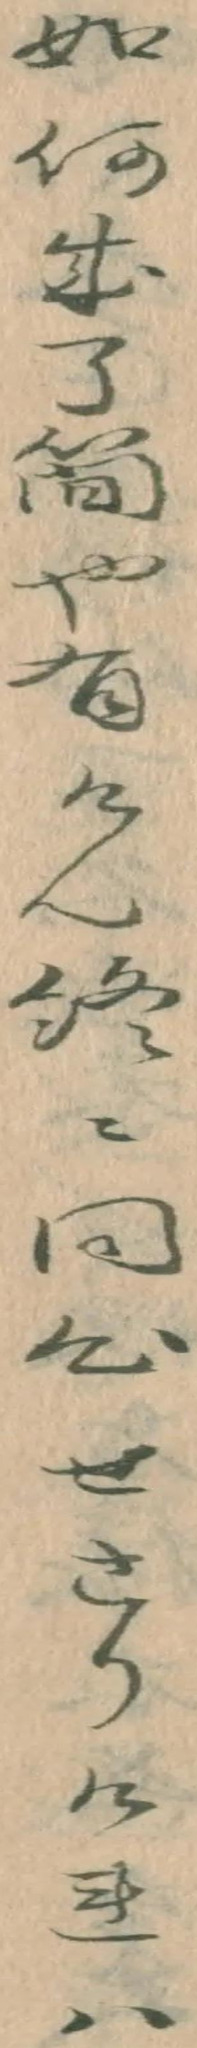如何成了簡や有けん終に同心せさりけ連は
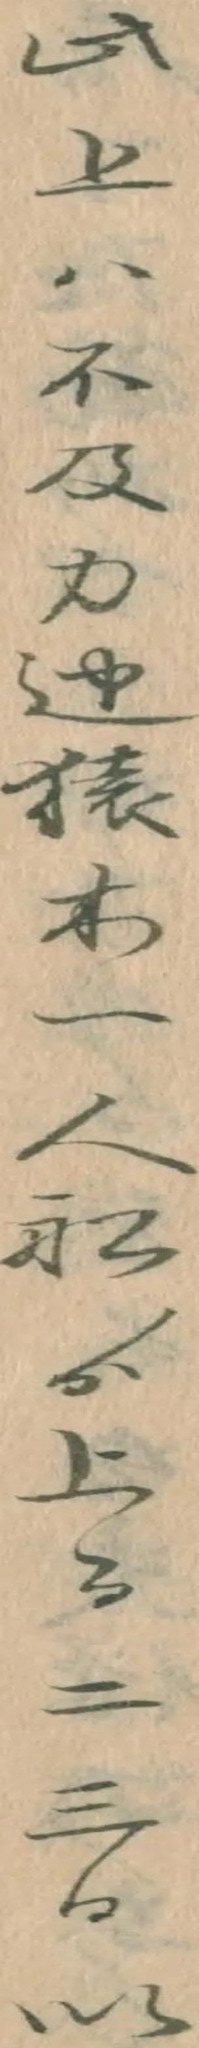此上は不及力迚猿木一人舩ゟ上る二三日以
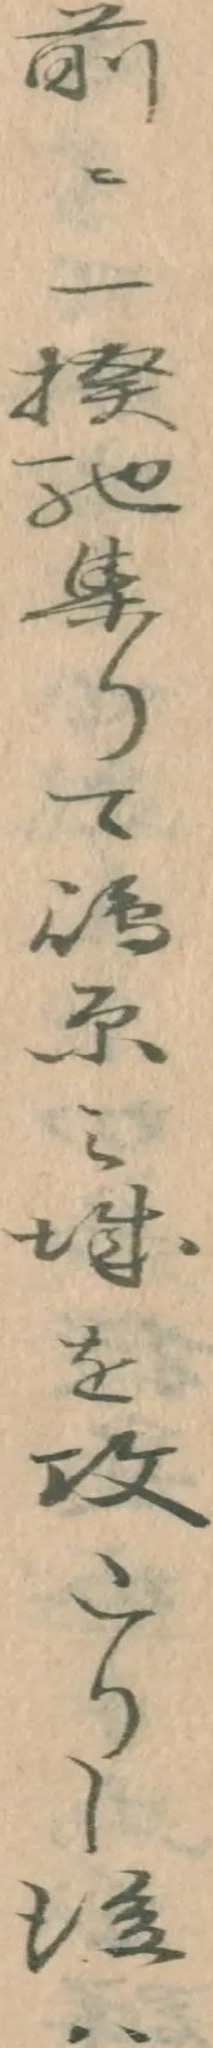前に一揆馳集りて島原之城を攻たりし後は

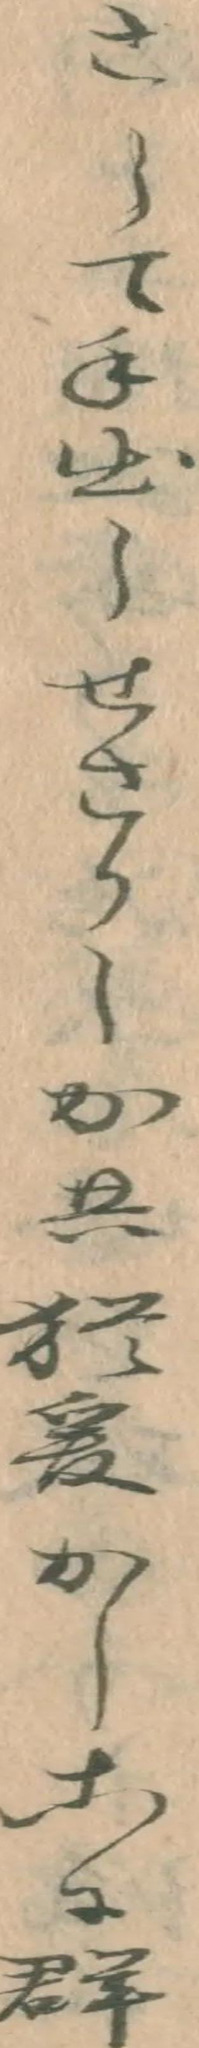さして手出しせさりしか共猶爰かし古に群
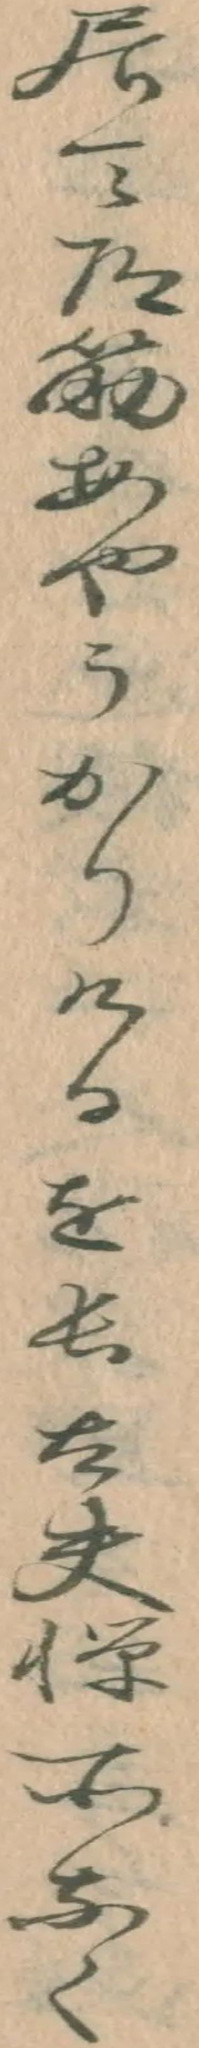居て道筋あやうかりけるを長太夫憚所なく
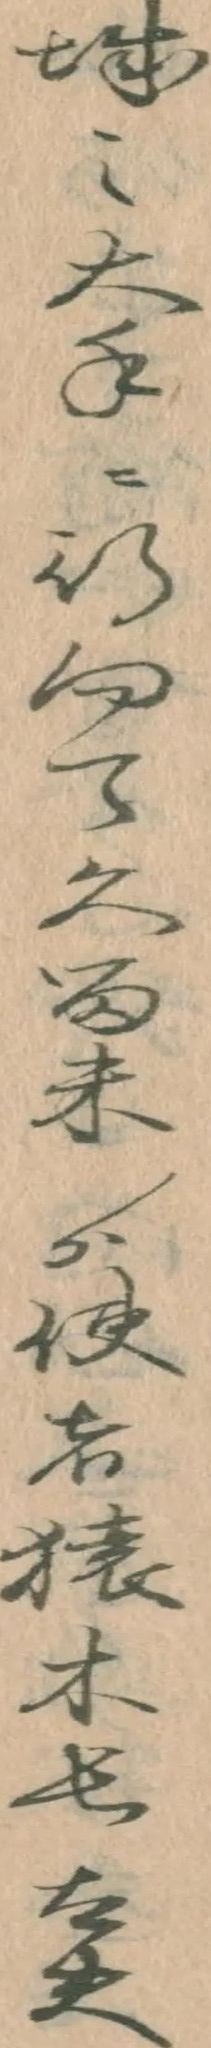城之大手に行向て久留米ゟ使者猿木長太夫
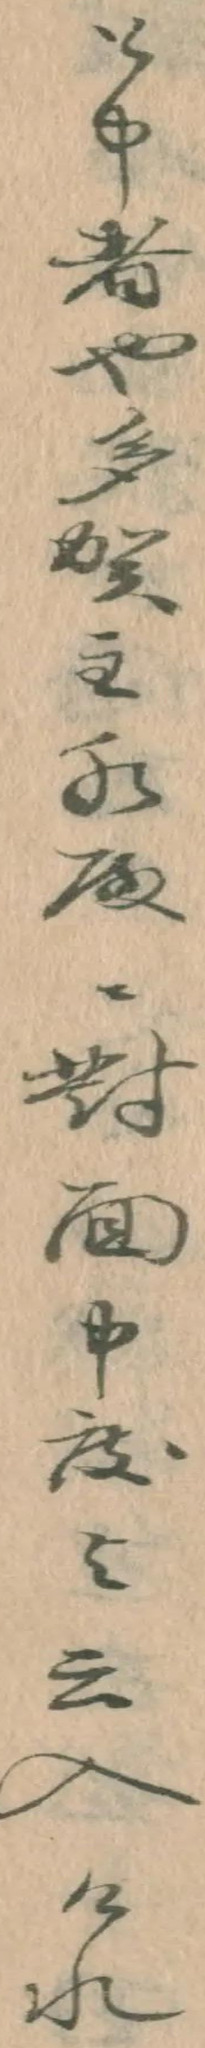と申者や多賀主水殿に対面申度与云入けれ
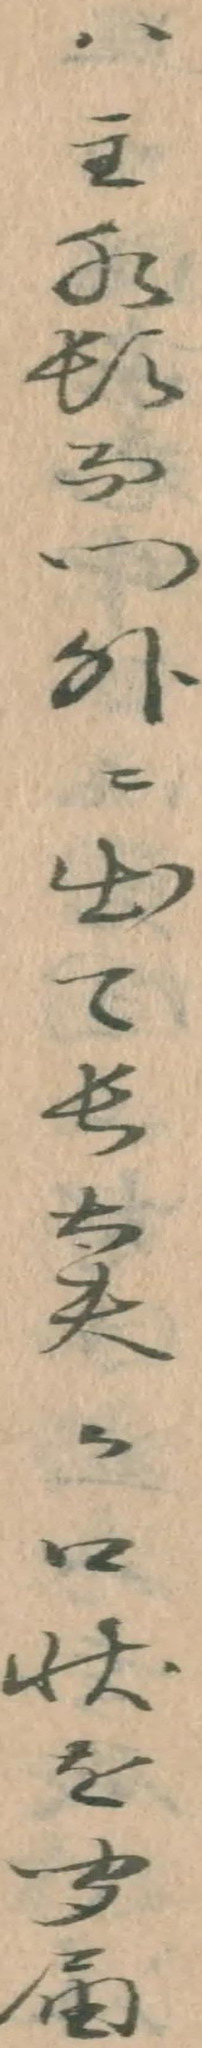は主水頓而門外に出て長太夫か口状を聞届
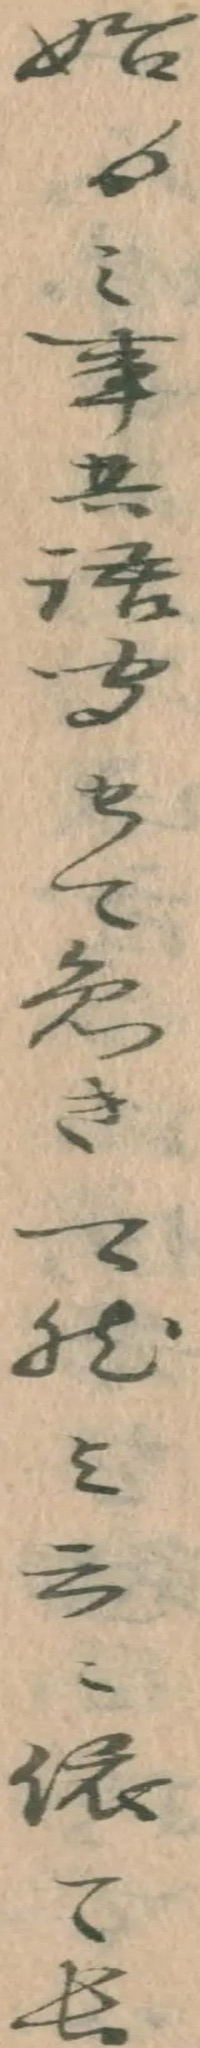始ゟ之事共語聞せて急き可然と云に依て長
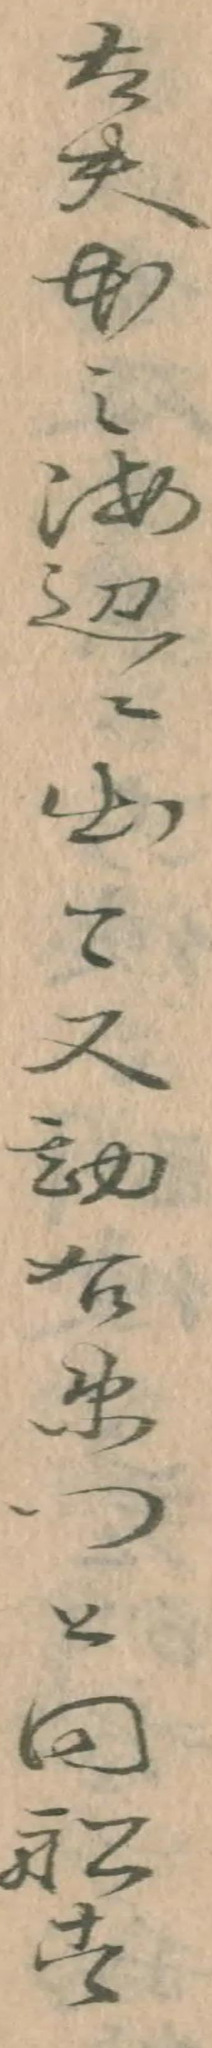太夫本之海辺に出て又勘右衛門と同舩春
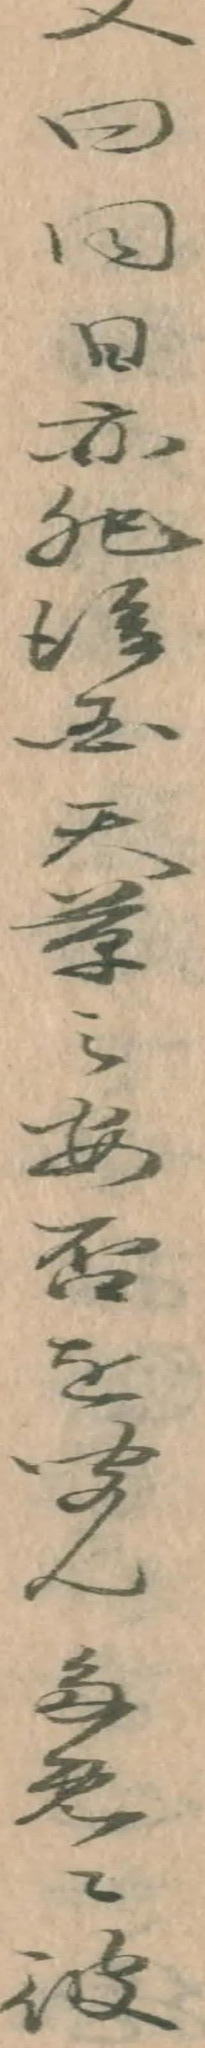又曰同日亦肥後国天草之安否を聞ん多免に彼
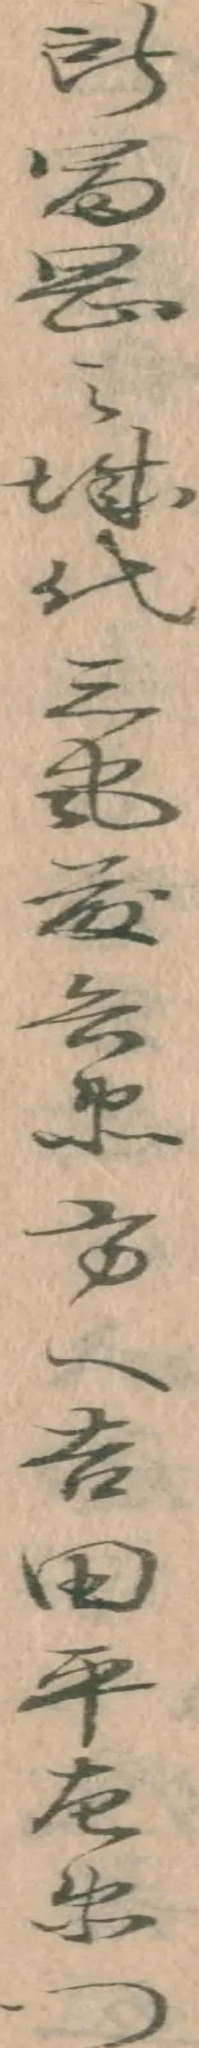新冨岡之城代三宅藤兵衛方へ吉田平左衛門
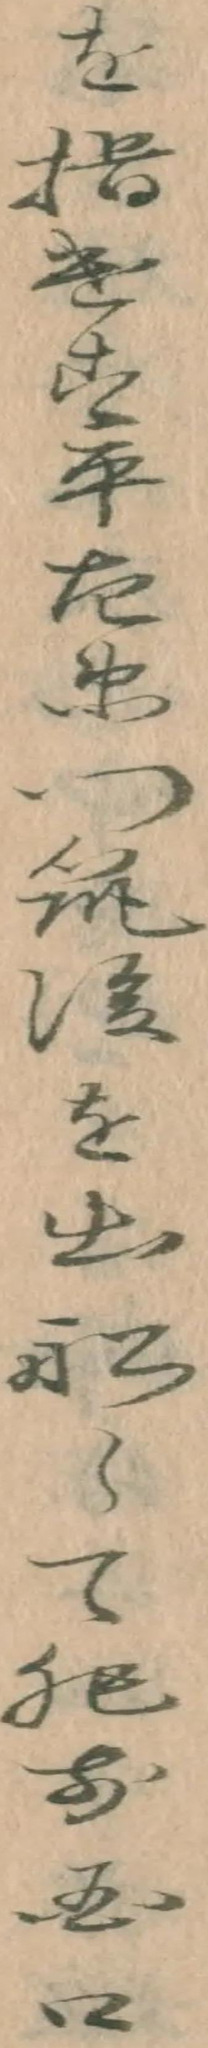を指遣春平左衛門筑後を出舩して肥前国口
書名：切支丹御退治記 49巻. [2]
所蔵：国立国会図書館 National Diet Library, JAPAN
